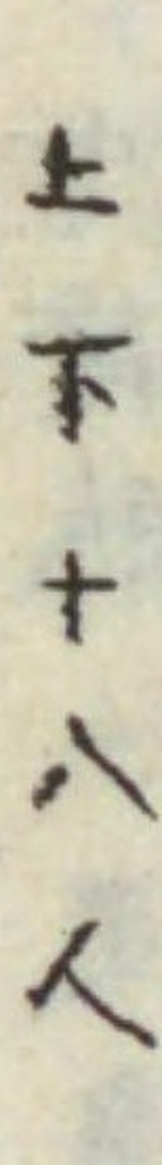上下十八人
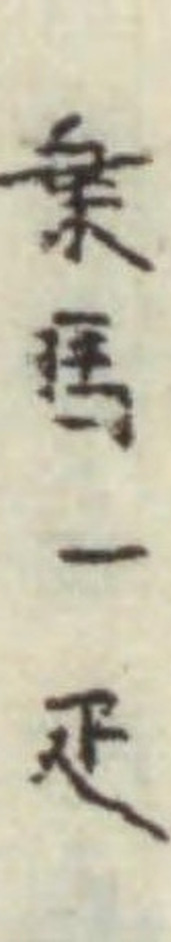乗馬一疋
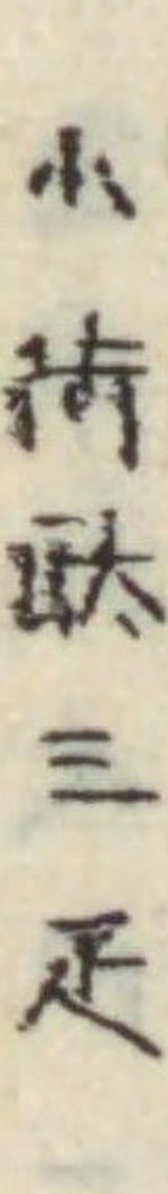小荷駄三疋
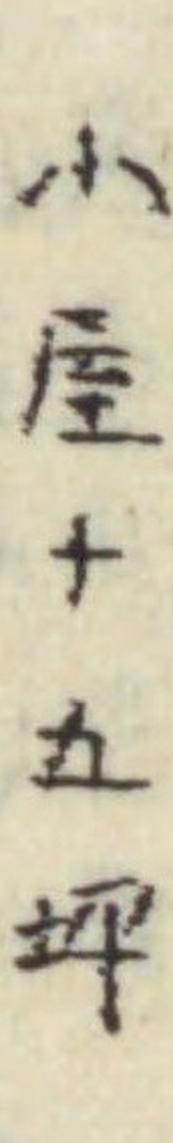小屋十五坪
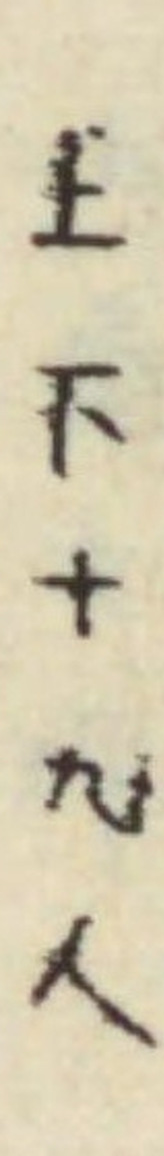上下十九人
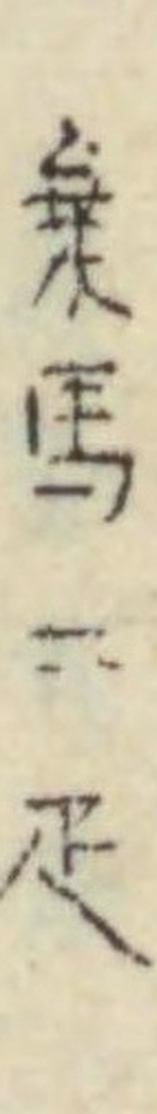乗馬一疋
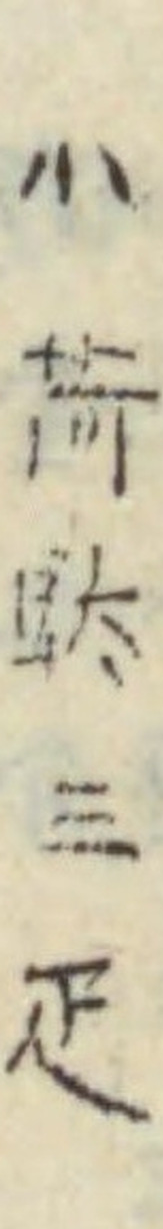小荷駄三疋
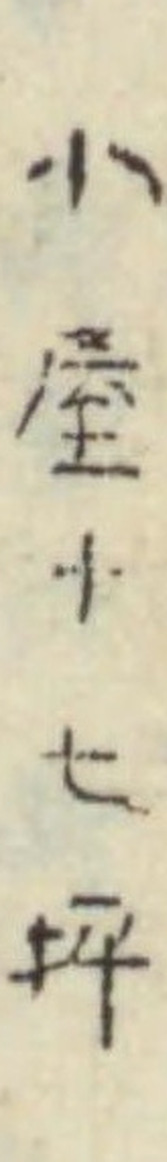小屋十二坪
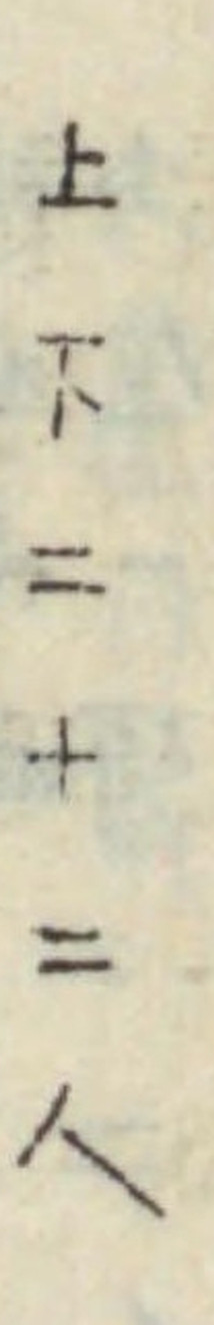上下二十二人
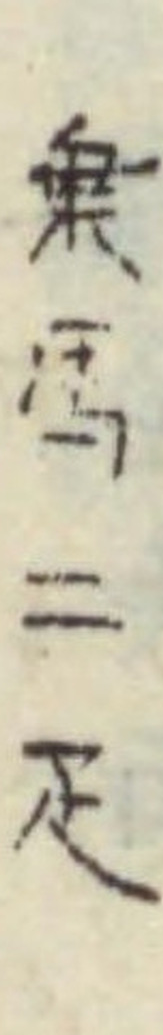乗馬二疋
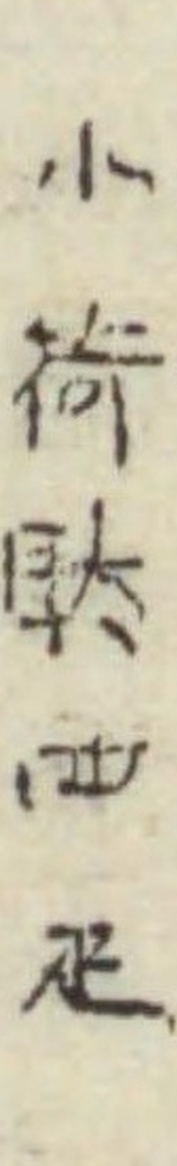小荷駄四疋
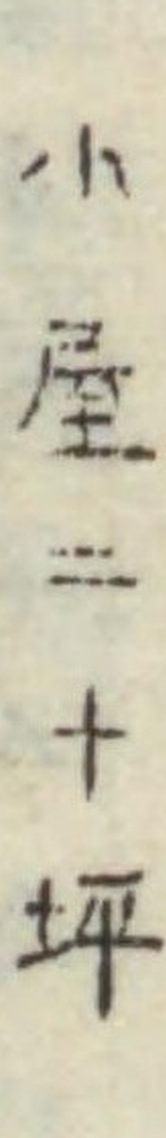小屋二十坪
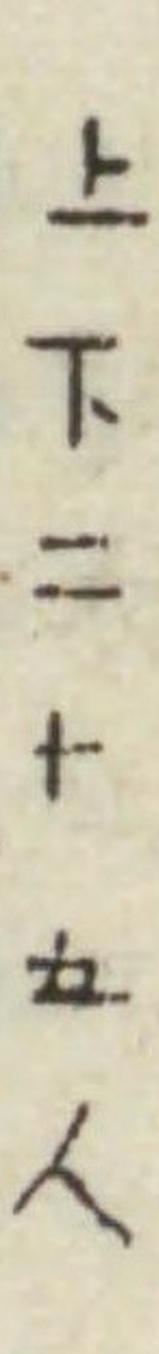上下二十五人
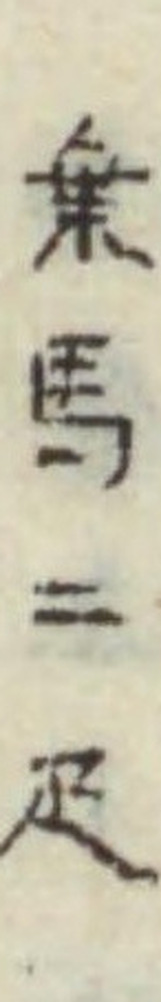乗馬二疋
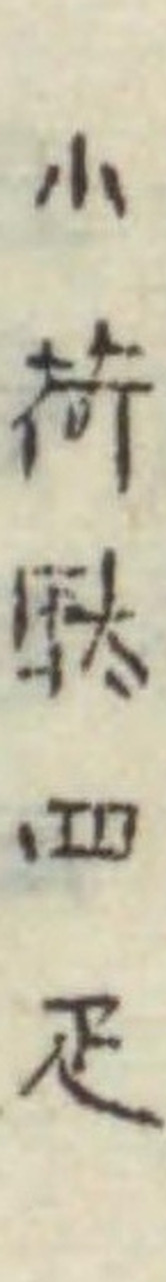小荷駄四疋
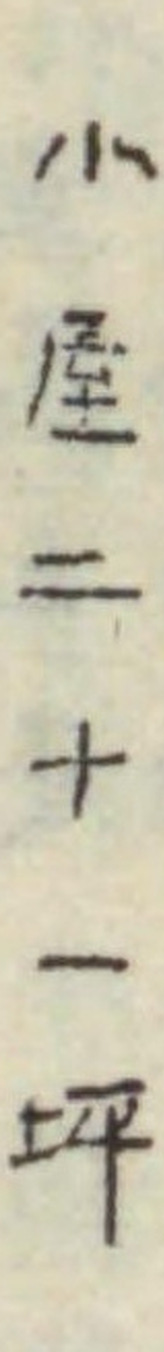小屋二十一坪
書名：三河吉田藩動員史料
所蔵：国立国会図書館 National Diet Library, JAPAN
